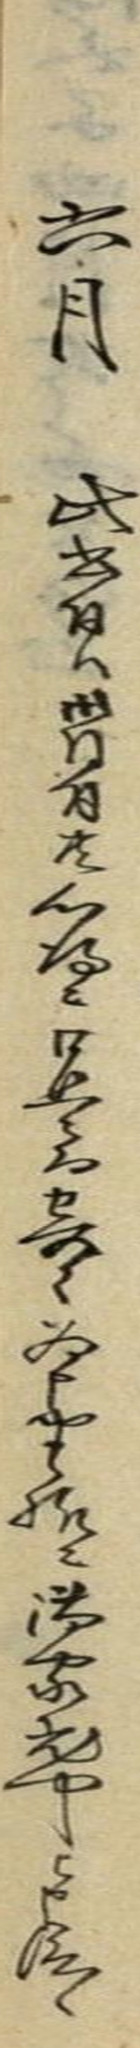六月此書付は御日付共心得に口上にて寄々為申聞候様に御家老中被申渡候
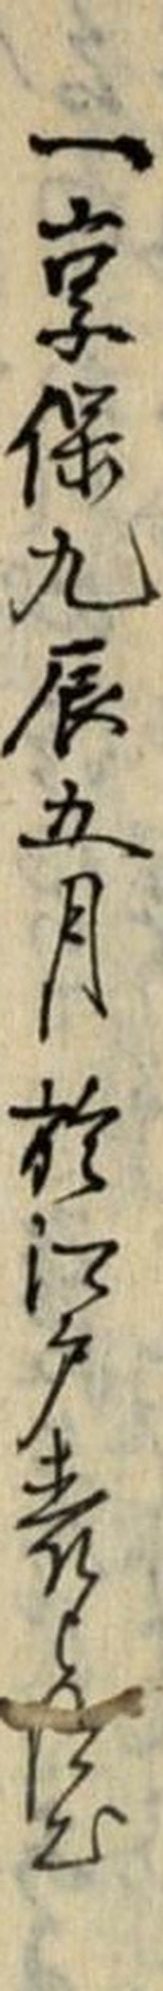一享保九辰五月於江戸表被仰出
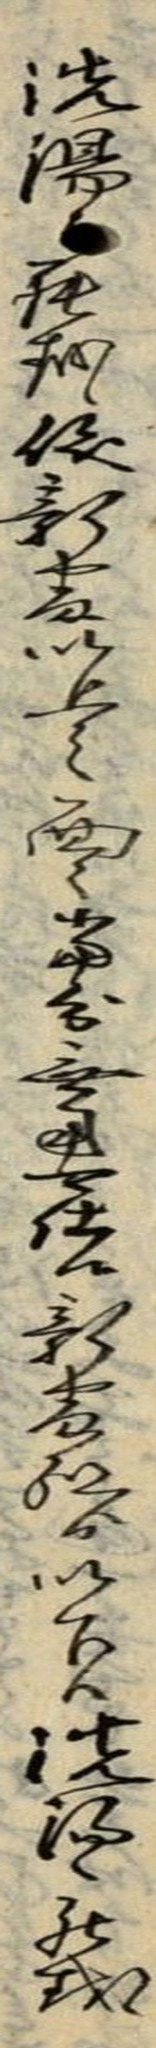洗湯へ罷越候儀新番以上之面々当分無用可仕候新番組ゟ以下は洗湯へ罷越候
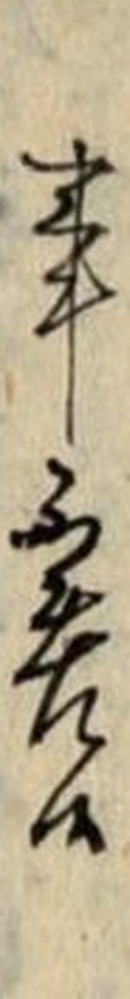事不苦候
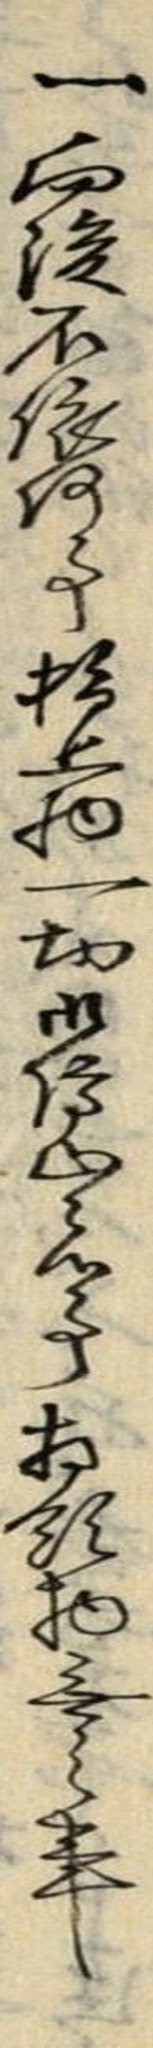一向後不依何事指上物一切御停止に候事拝領物無之事
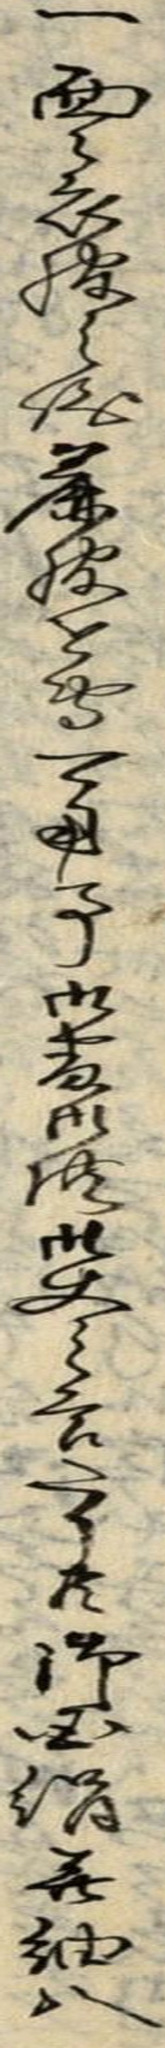一面々衣服之儀麁服を専可用事御番御供御使之節たり共御国絹幷紬八
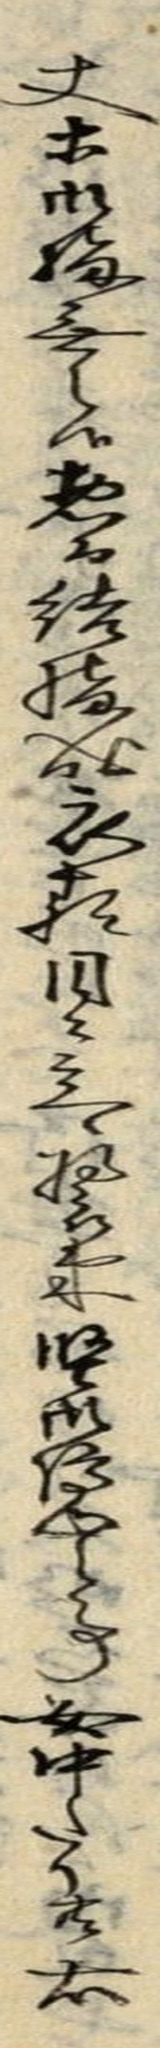丈等御構無之候惣て結構成衣類目に立候装束堅御停止之事女中たり共右
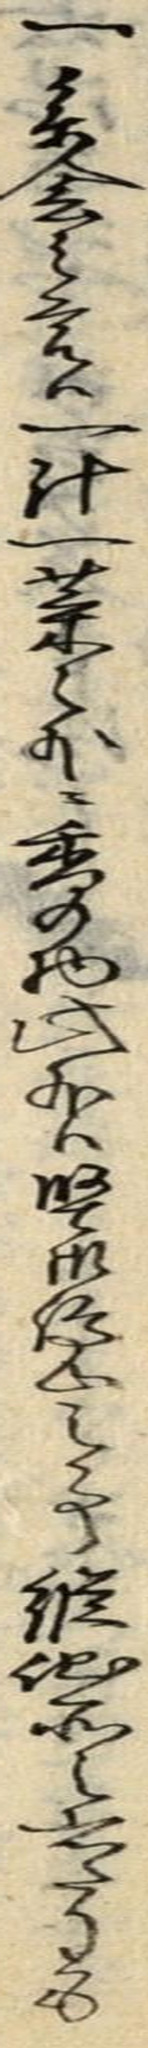一参会之節は一汁一菜の外に香の物此外は堅御停止之事縦他所之者たりとも
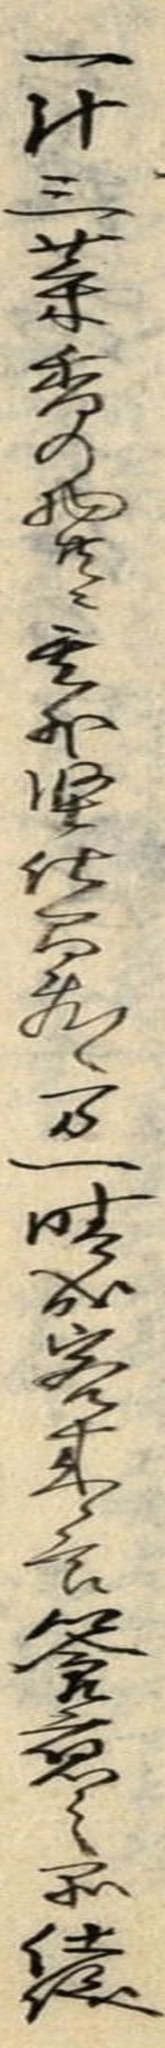一汁三菜香の物共に其外堅仕間敷候万一晴成客来候節饗応之品仕儀
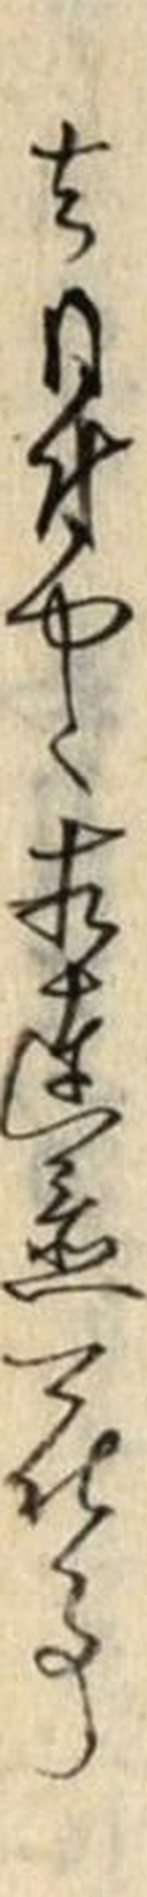は目付中へ相達置可仕事
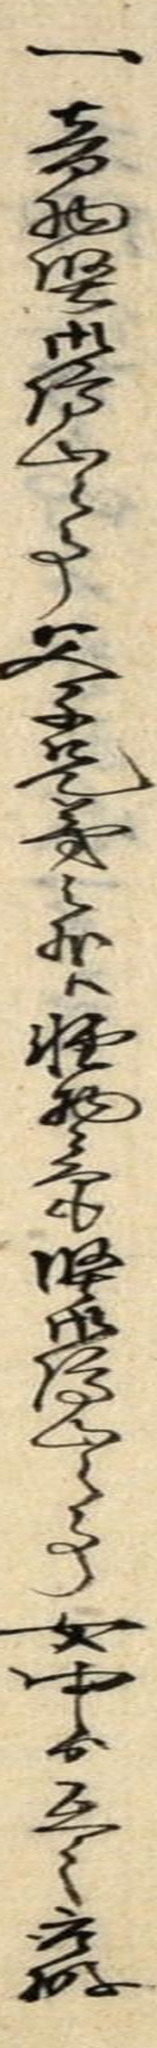一音物堅御停止之事父子兄弟之外は軽物にても堅御停止之事女中ゟ互之取扱
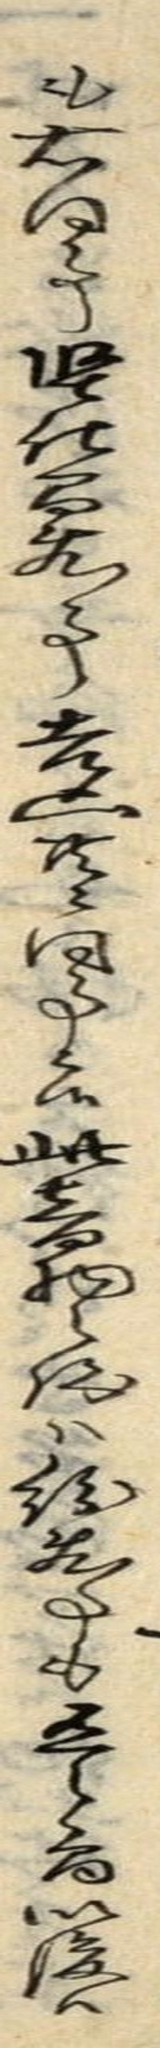も右同事堅仕間敷事吉凶共に同事に候此音物之儀は紛敷事も有之候間以後は
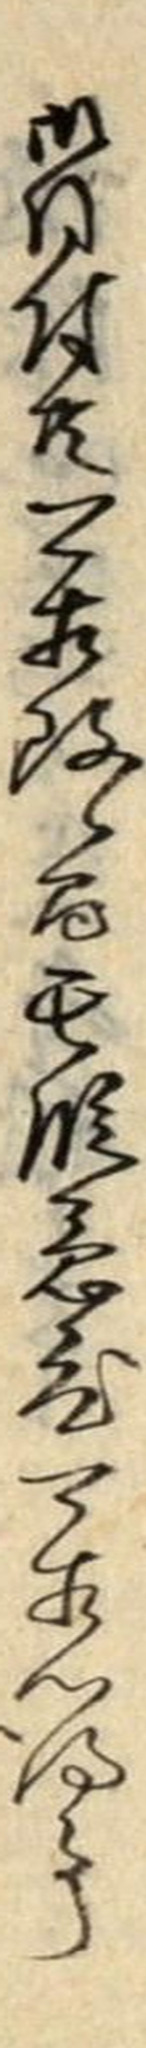御目付共可相改候間其段急度可相心得事

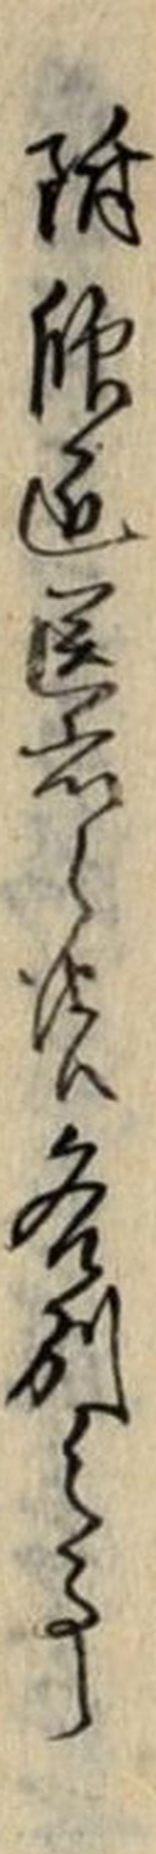附師匠医者之儀は格別之事
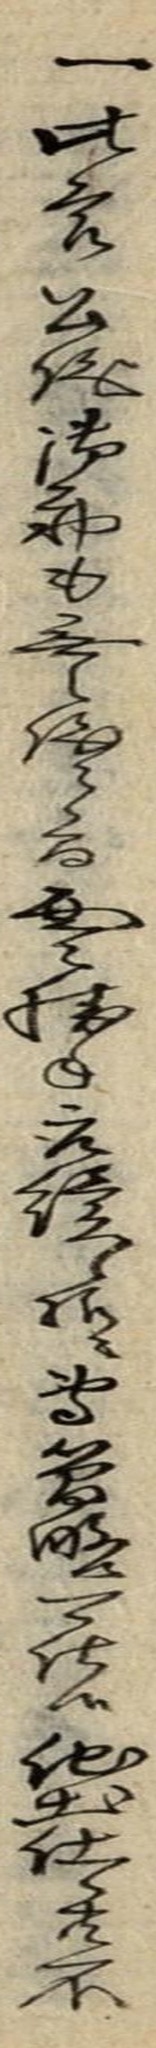一此節公儀御勤も無之儀に候間面々勝手取続候様に専簡略可仕候他出仕候共不
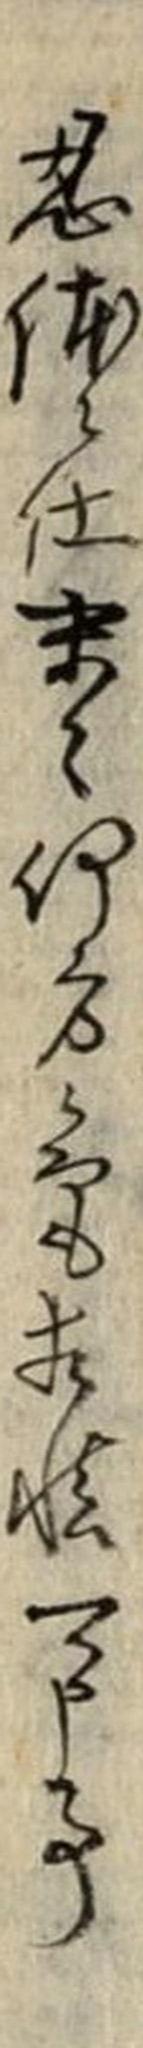忍体に仕末々何方にても相慎可申事
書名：三都并道中之部
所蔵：福井県文書館 Fukui Prefectural Archives
